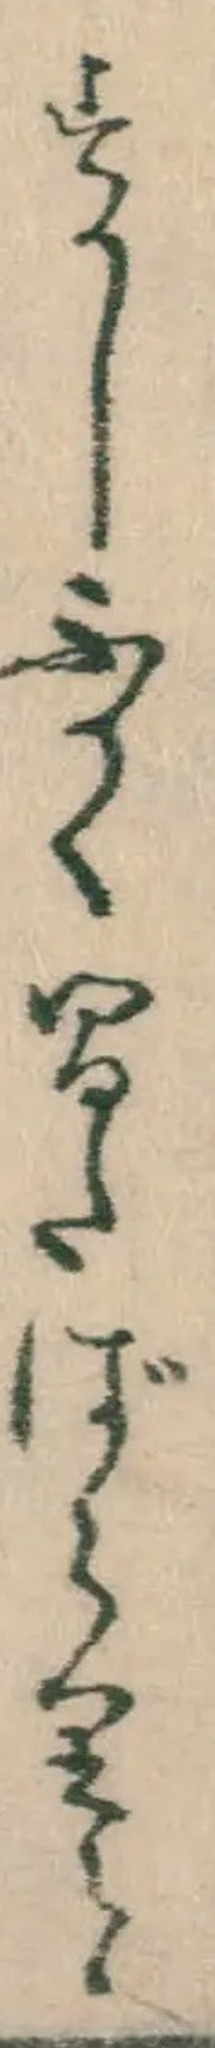すかしふかく間たばらりと
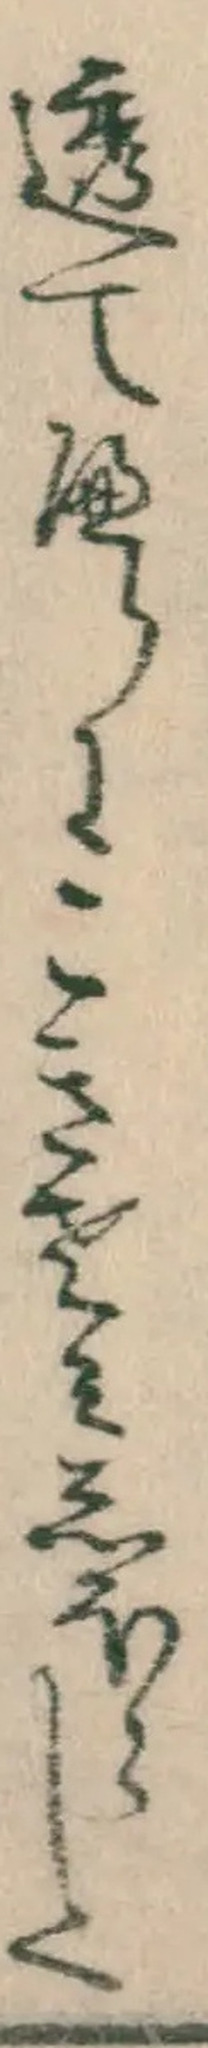透てへりにこきさみしほら
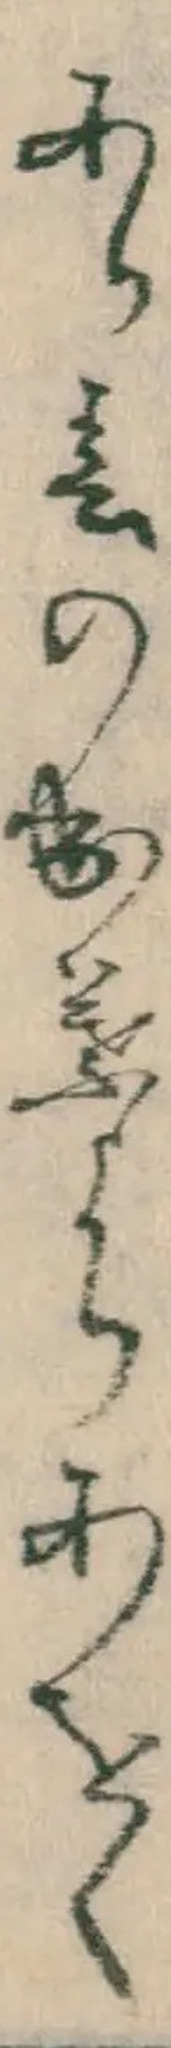あり春の出葉よりあをく
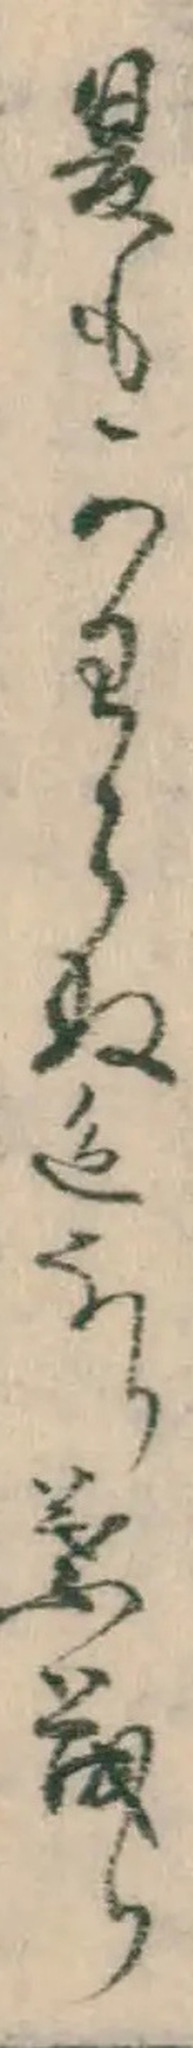夏もかわらぬ色なり葉茂り
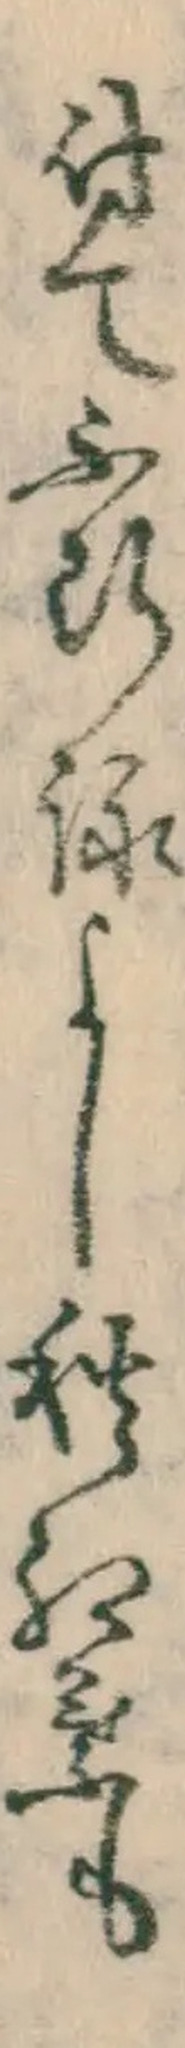付て不断詠よし秋紅葉も
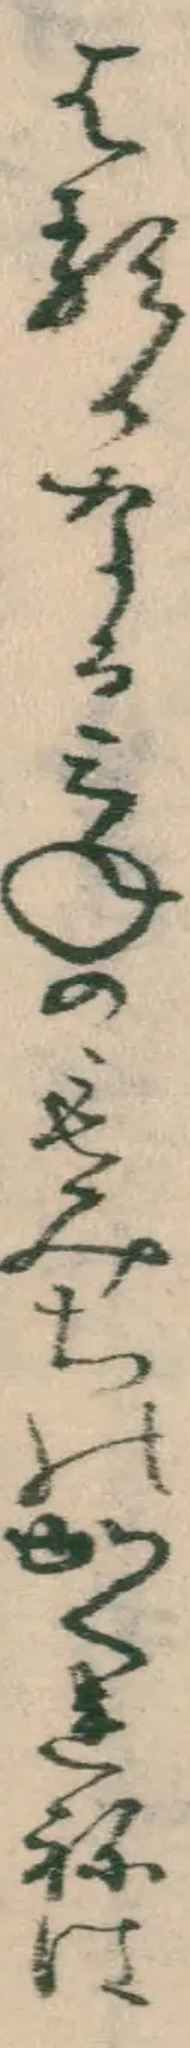はるかなるみねのもみちのかくれねは
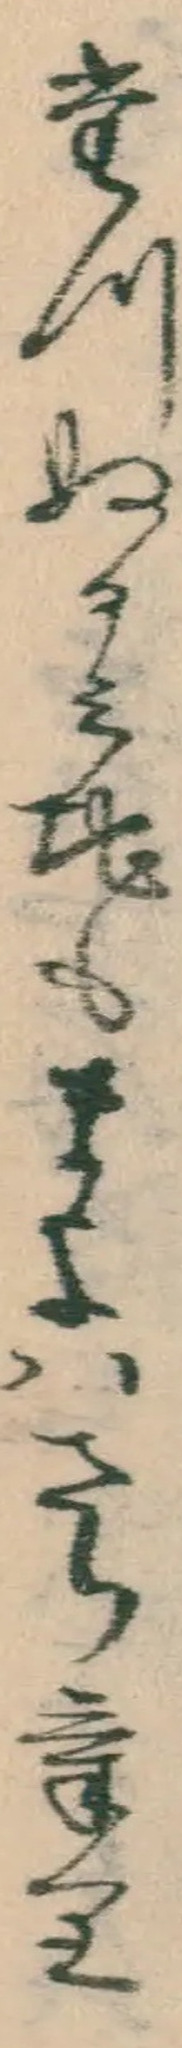たつぬるみちもまよはさりけり
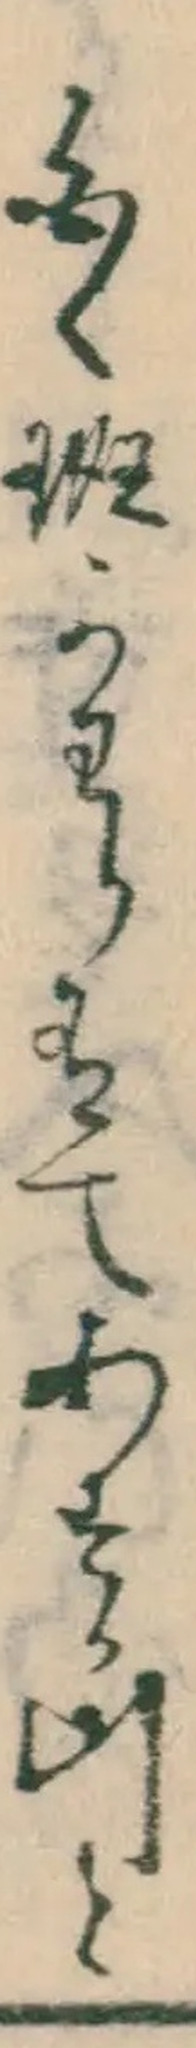白く斑かわり有てあすか川と
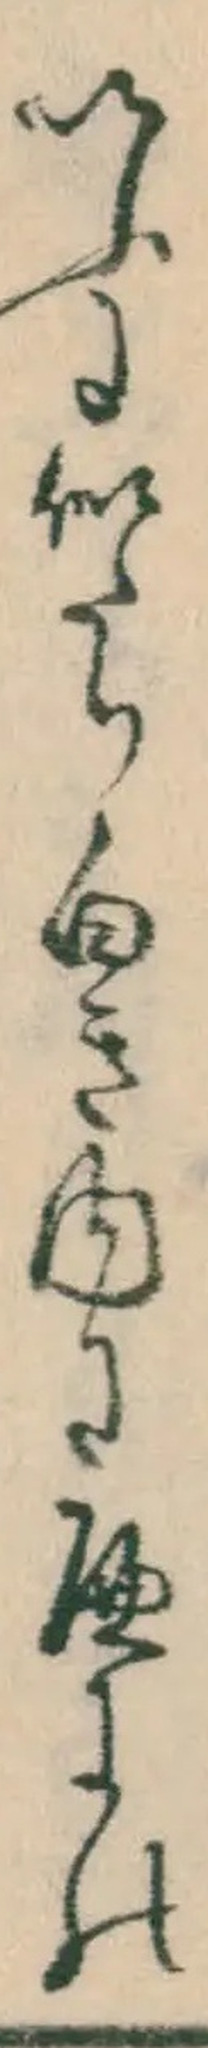いふに似たり白き内にへにの
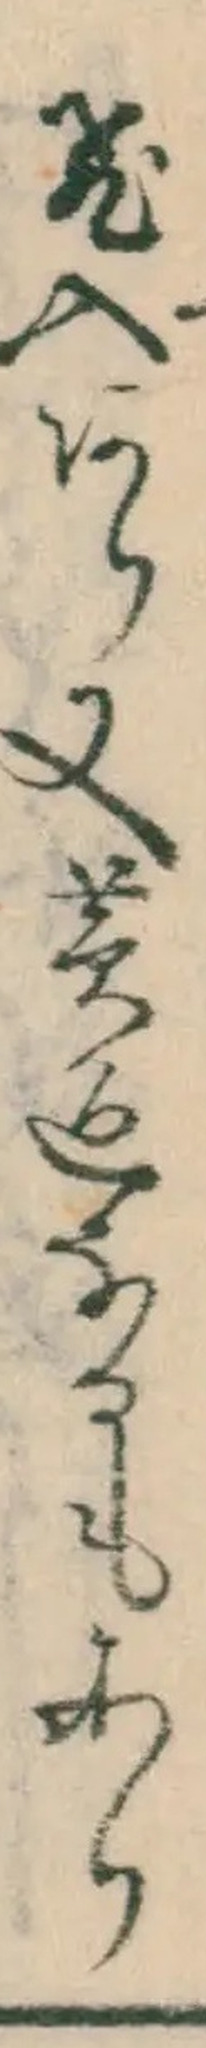飛入あり又黄色なるもあり
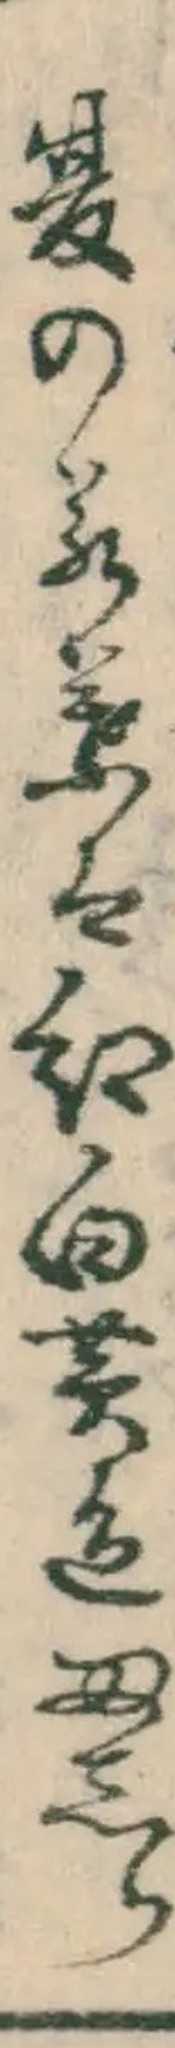夏の若葉は紅白黄色ましり
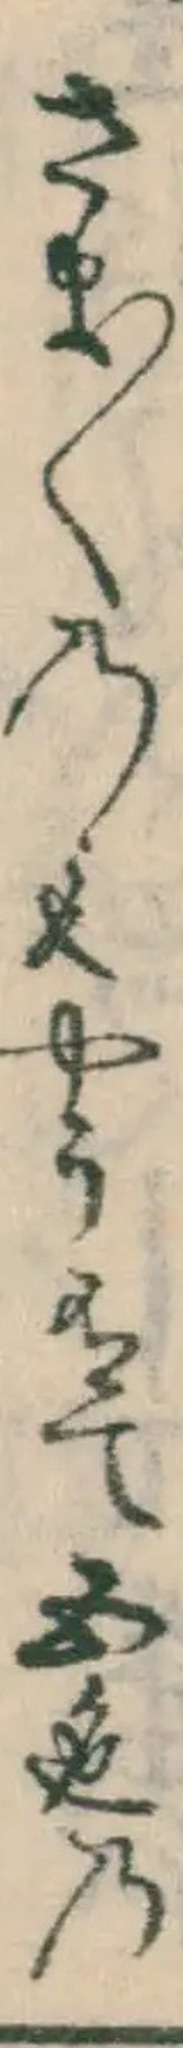さま〳〵のもやう有て五色の
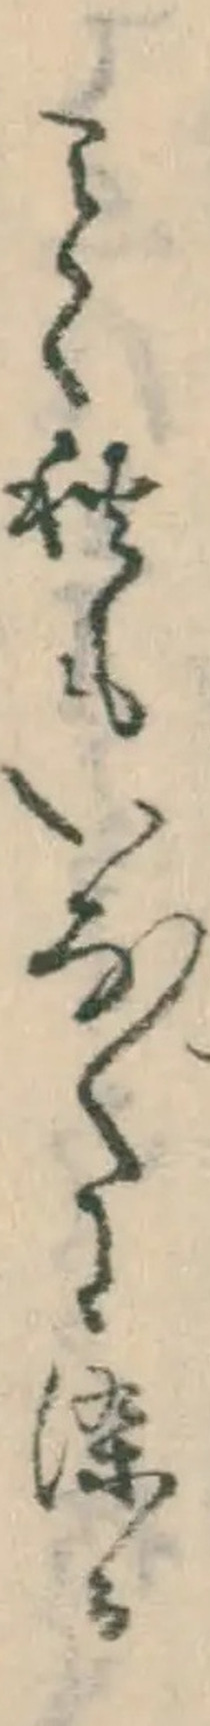ことく秋もいろいろに染る
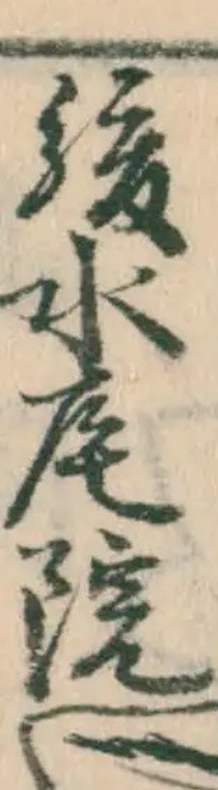御水尾院
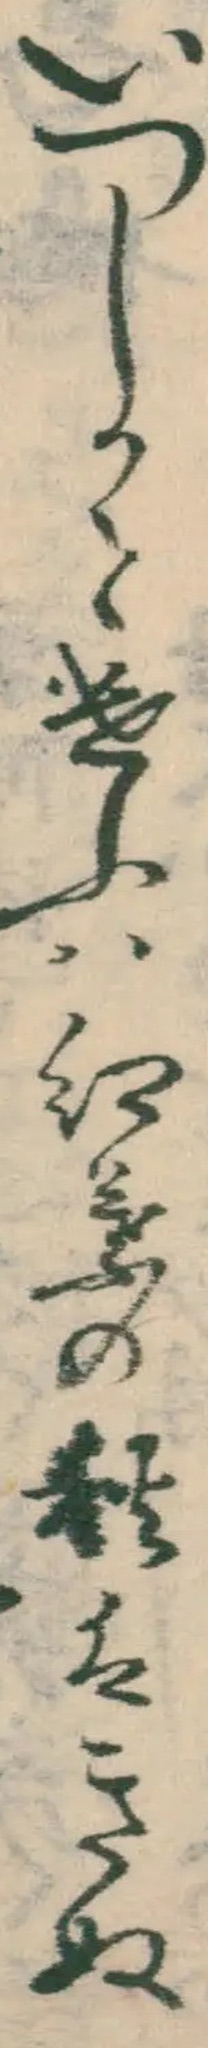いつしかとけふは紅葉の秋はきぬ
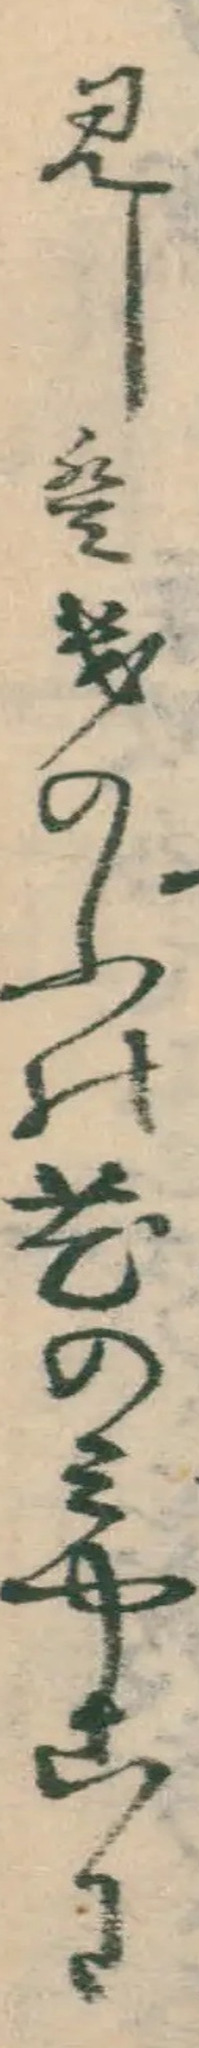見しはきのふの花のみやこに
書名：紅葉集
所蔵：国立国会図書館 National Diet Library, JAPAN
